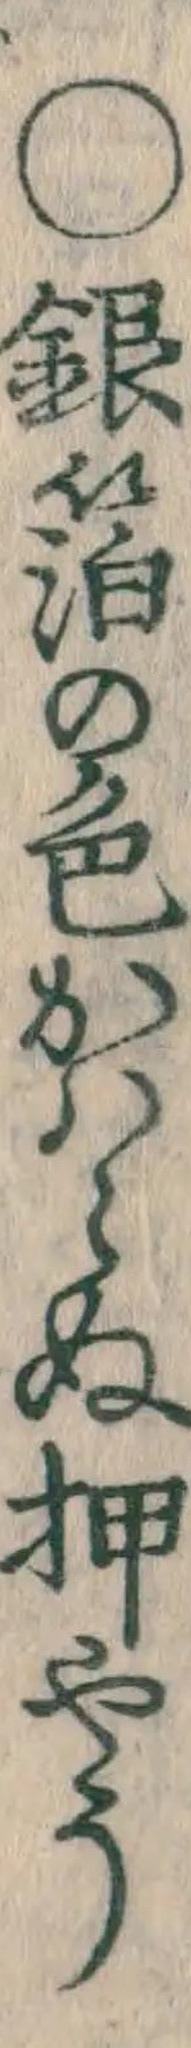○銀箔の色かはらぬ押やう
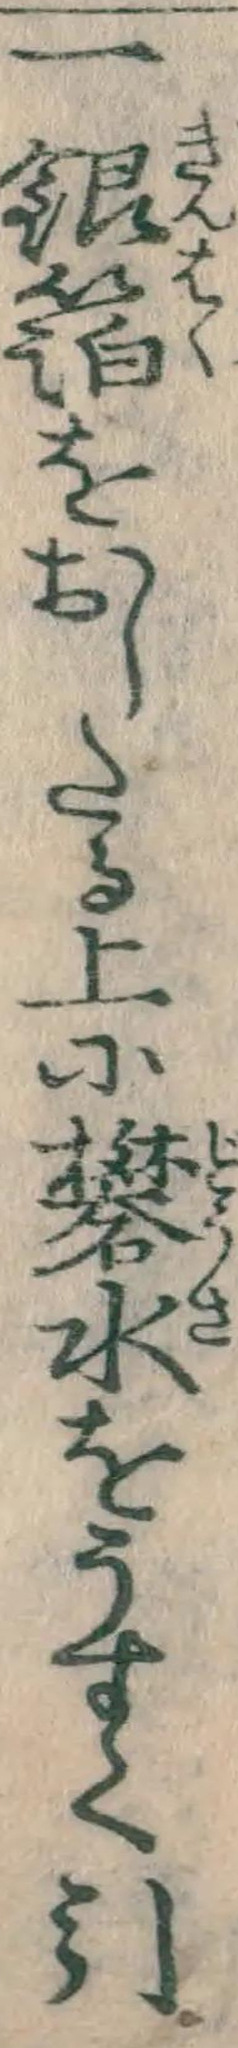一銀箔をおしたる上に礬水をうすく引
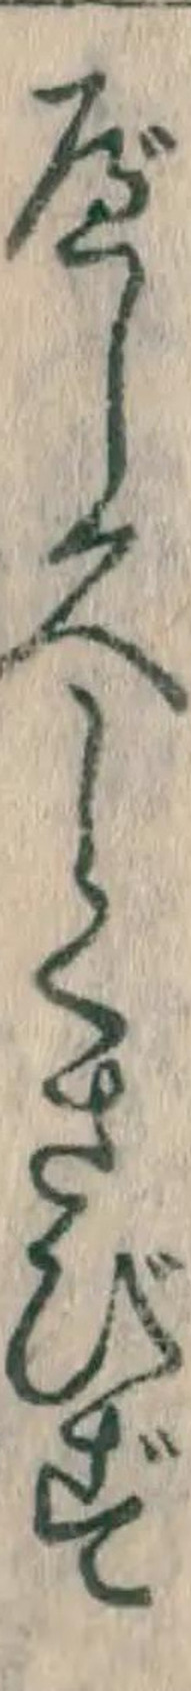べし久しくさびず
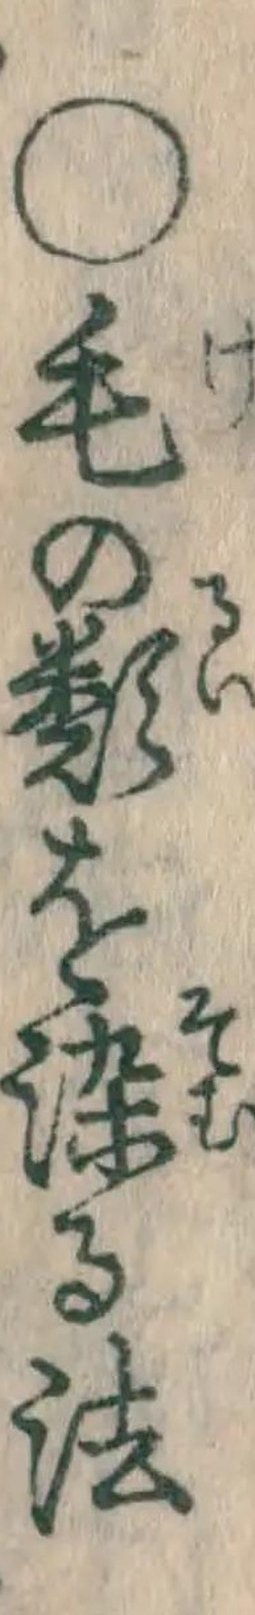○毛の類を染る法
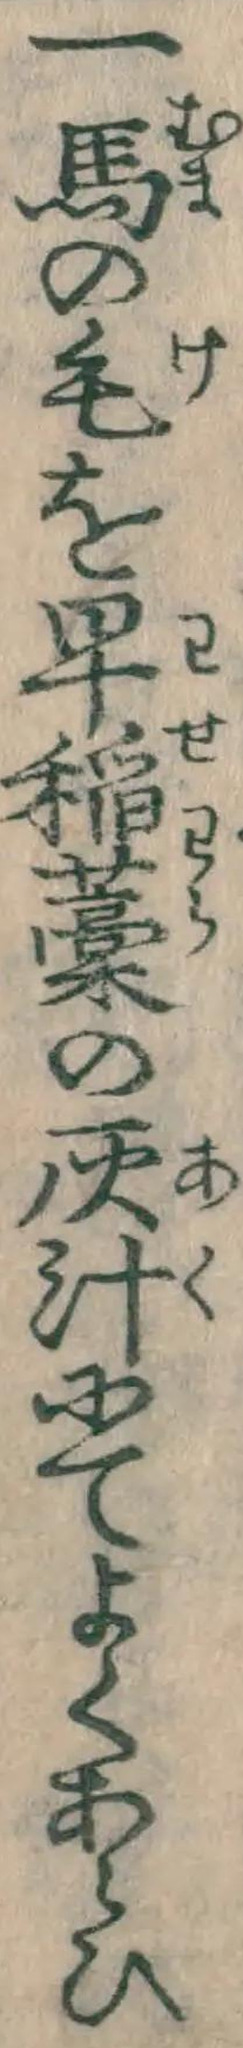一馬の毛を早稲藁の灰汁にてよくあらひ

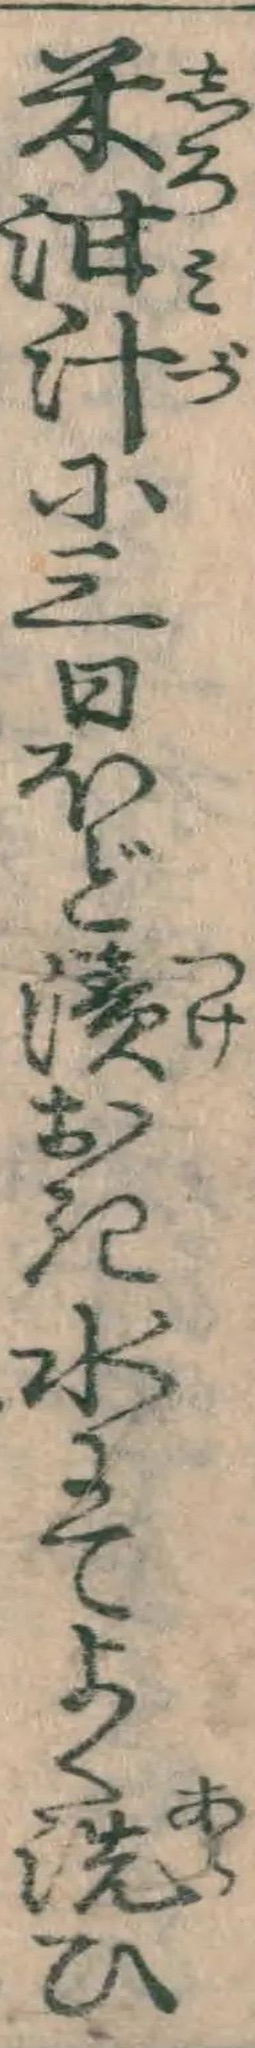米泔汁に三日ほど漬おき水にてよく洗ひ
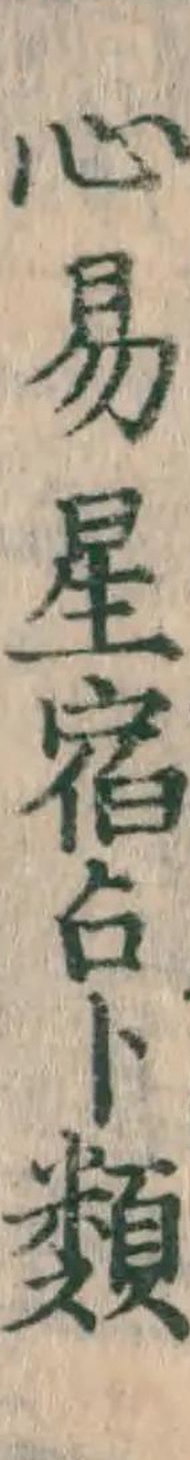心易星宿占卜類
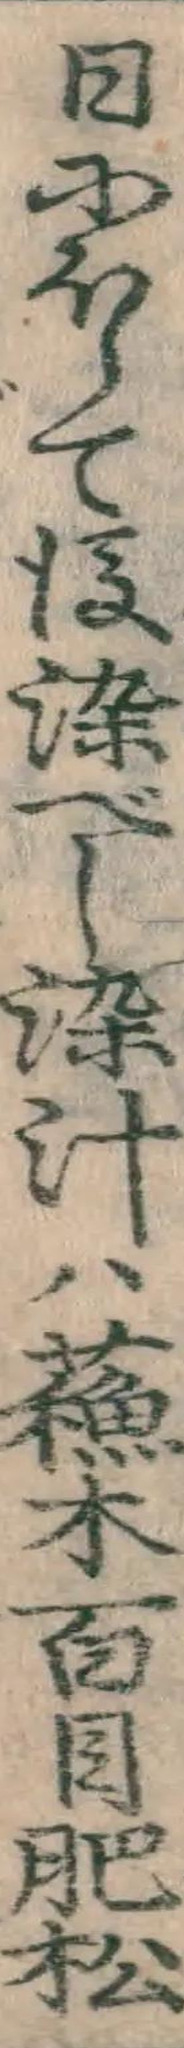日にほして後染べし染汁は蘇木百目肥松
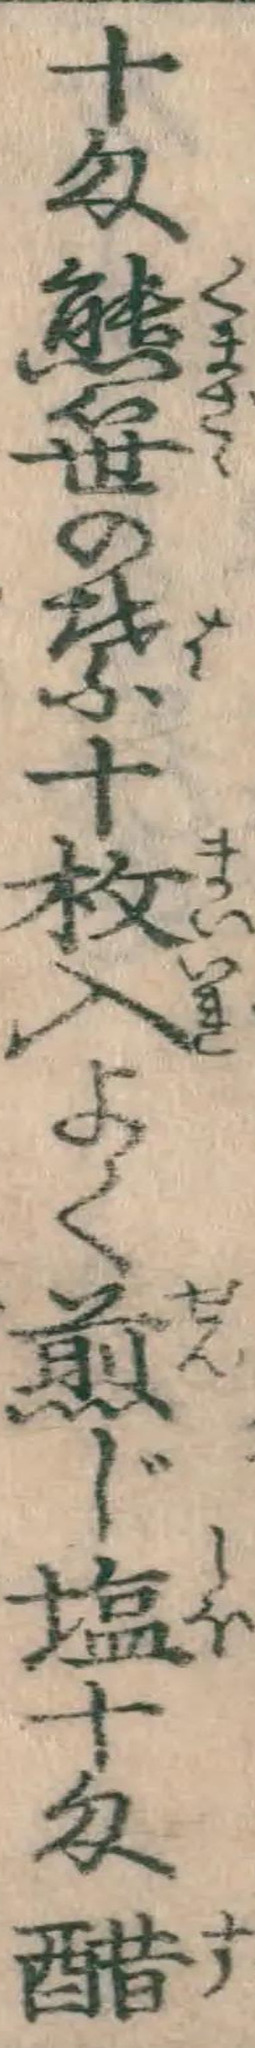十匁熊笹の葉十枚入よく煎じ塩十匁醋
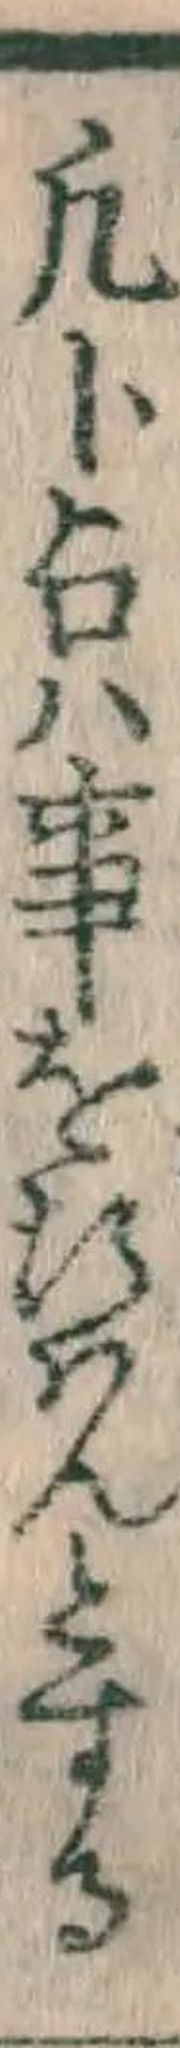凡卜占は事を行はんとする
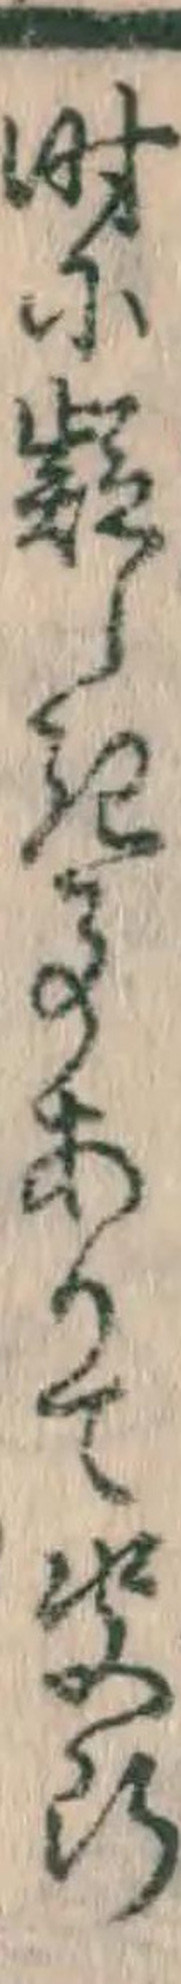時に疑しき事ありて決断
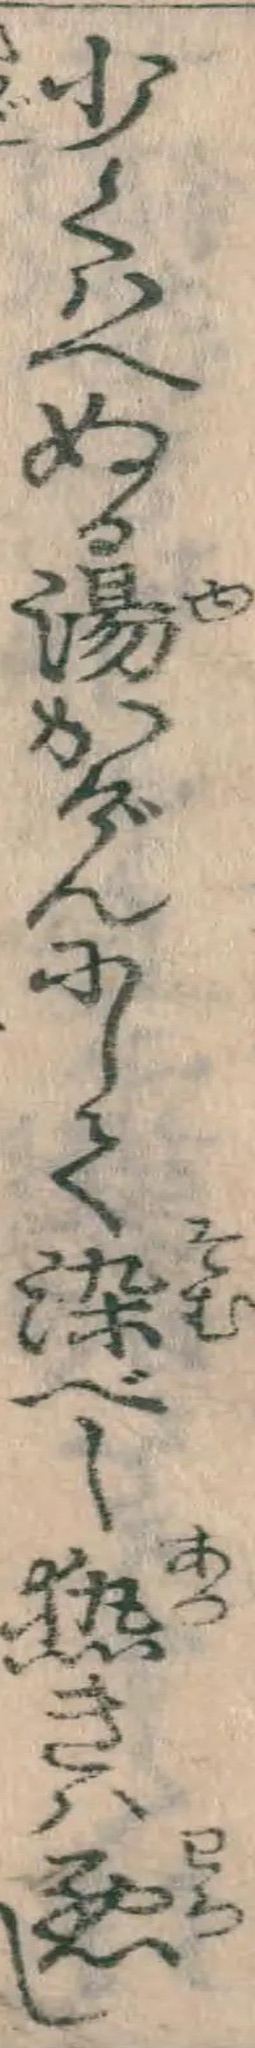少くはへぬる湯かげんにして染べし熱きは悪し
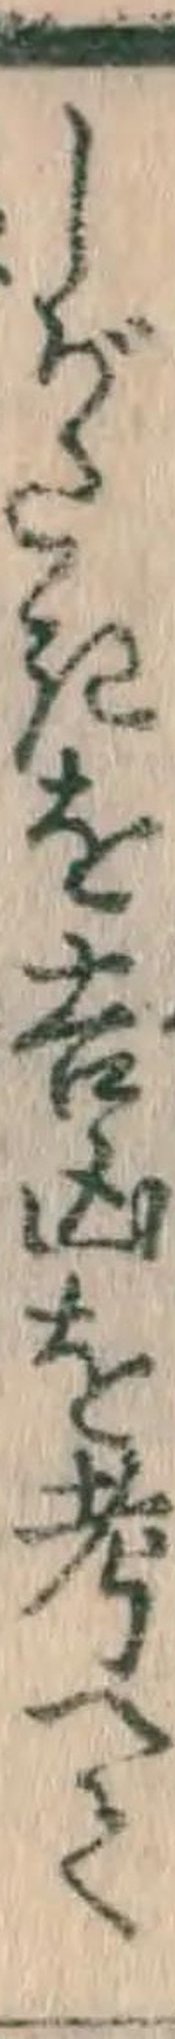しがたきを吉凶を考へて
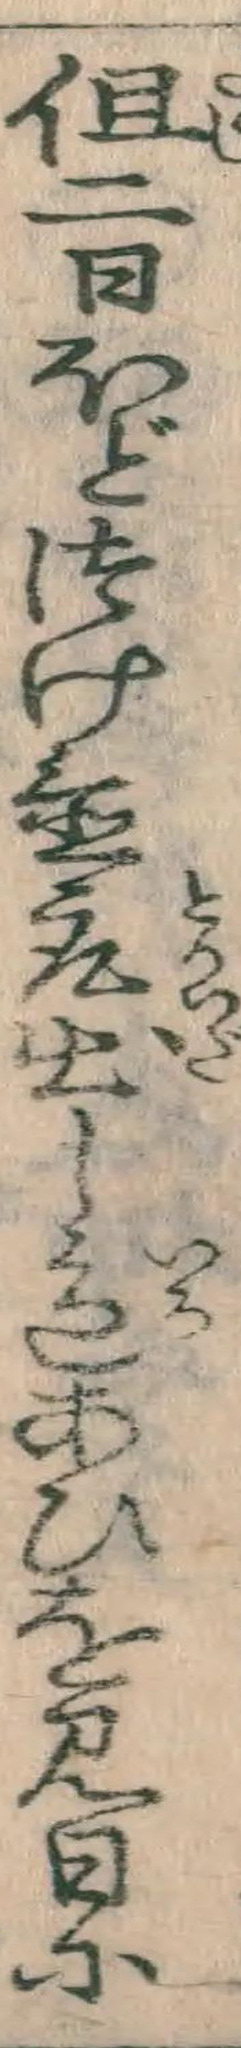但二日ほどつけ置取出し色あひを見日に
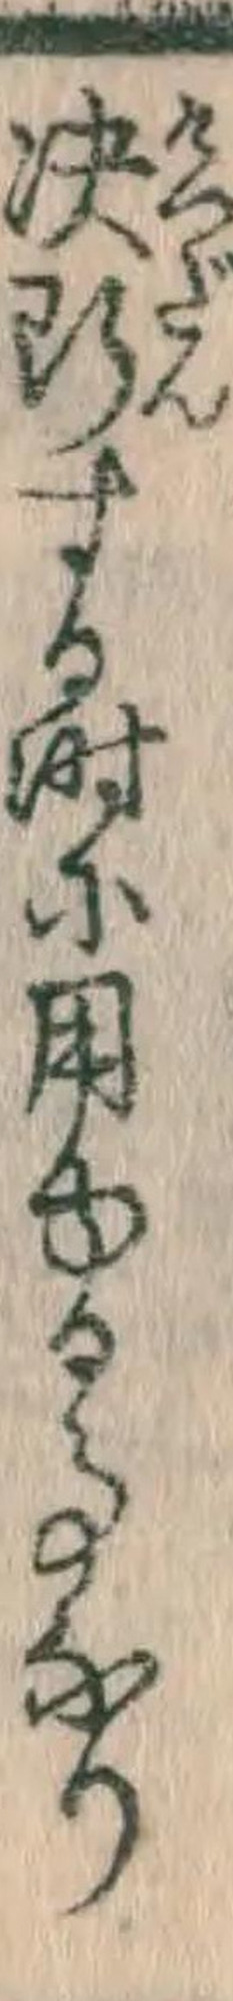決断する時に用ゆる事なり
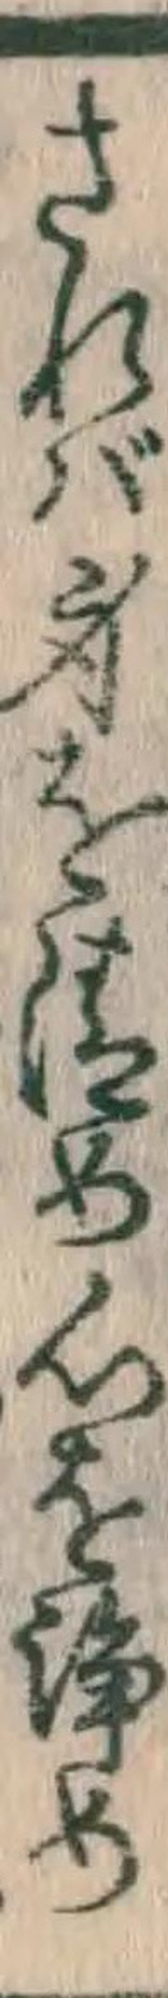されば身を清め心を浄め
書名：広益秘事大全 3巻. [1]
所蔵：国立国会図書館 National Diet Library, JAPAN
